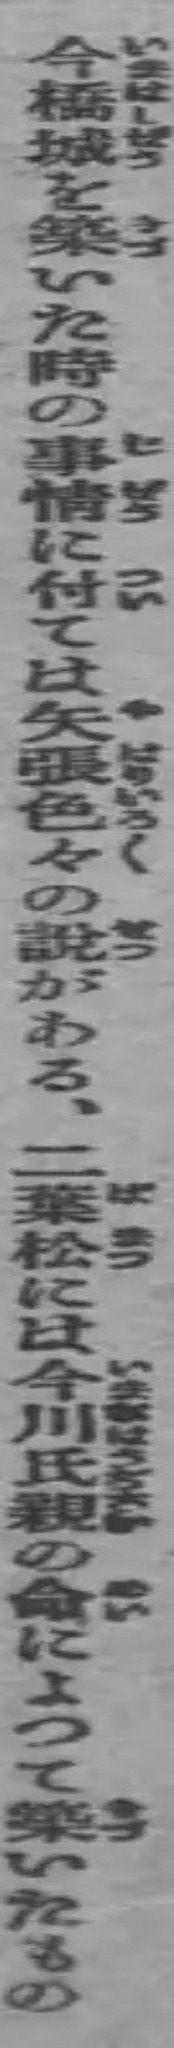今橋城を築いた時の事情に付ては矢張色々の説がある、二葉松には今川氏親の命によつて築いたもの
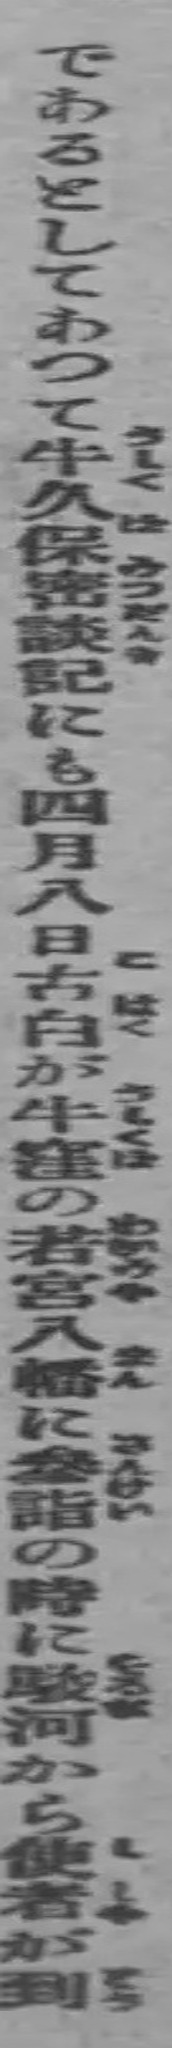であるとしてあつて牛久保密談記にも四月八日古白が牛窪の若宮八幡に参詣の時に駿河から使者が到
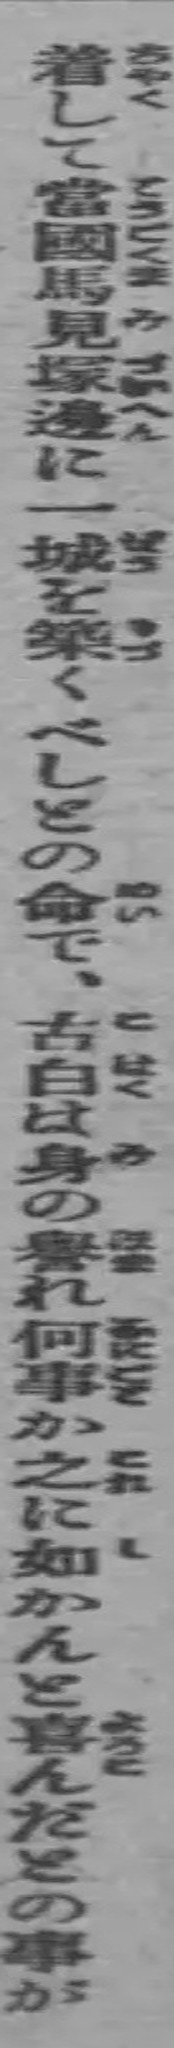着して当国馬見塚辺に一城を築くべしとの命で、古白は身の誉れ何事か之に如かんと喜んだとの事が
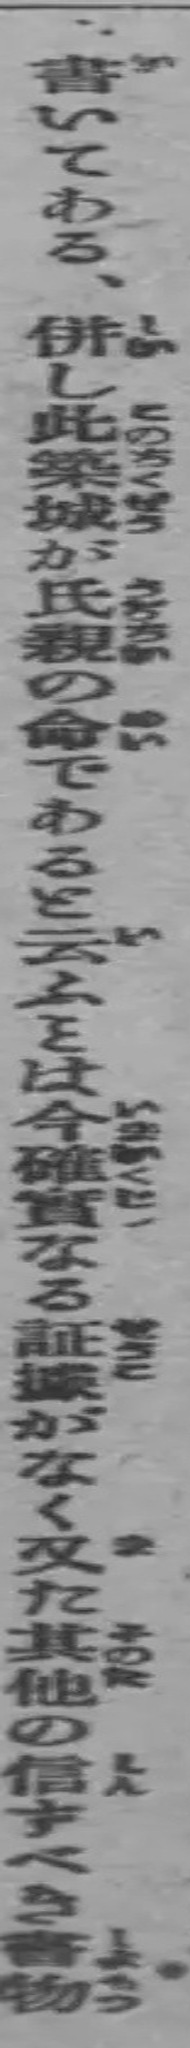書いてある、併し此築城が氏親の命であると云ふことは今確実なる証拠がなく又た其他の信ずべき書物
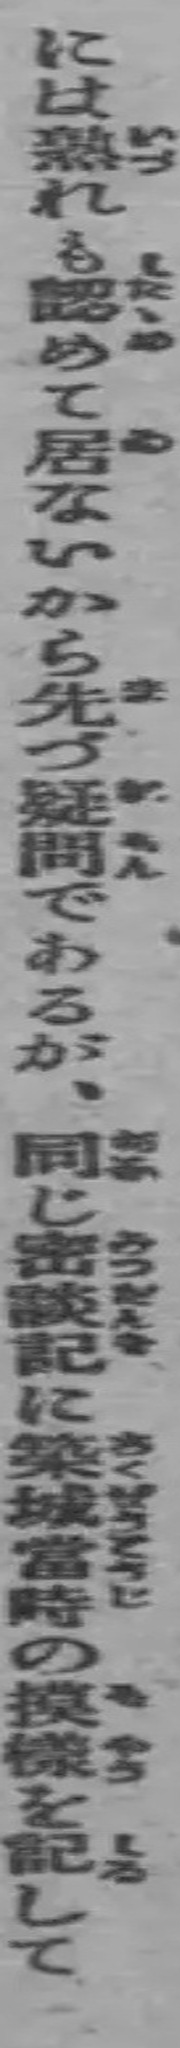には熟れも認めて居ないから先づ疑問であるが、同じ密談記に築城当時の模様を記して
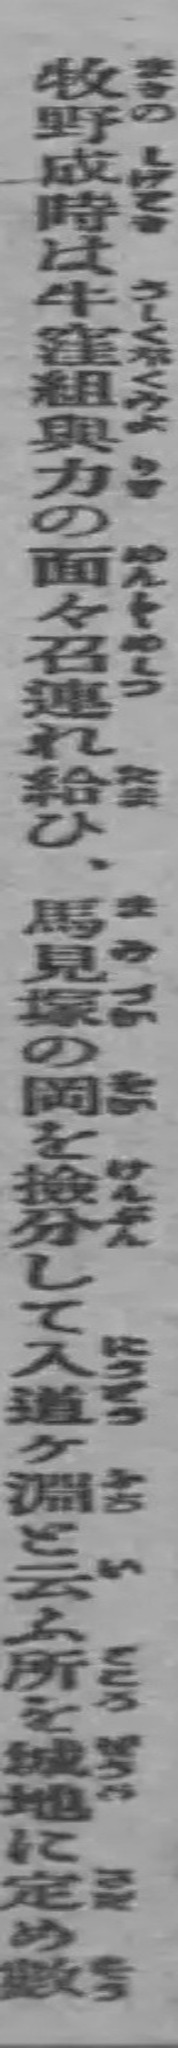牧野成時は牛窪組与力の面々召連れ給ひ、馬見塚の岡を撿分して入道ケ淵と云ふ所を城地に定め数
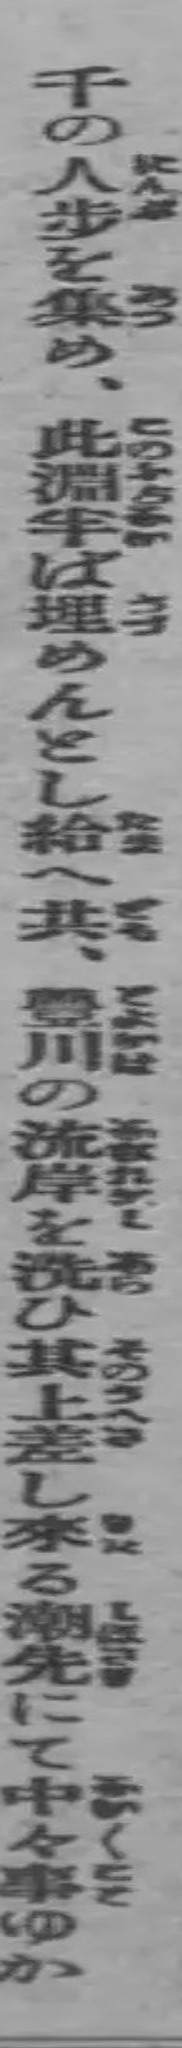千の人歩を集め、此淵半ば埋めんとし給へ共、豊川の流岸を洗ひ其上差し来る潮先にて中々事ゆか
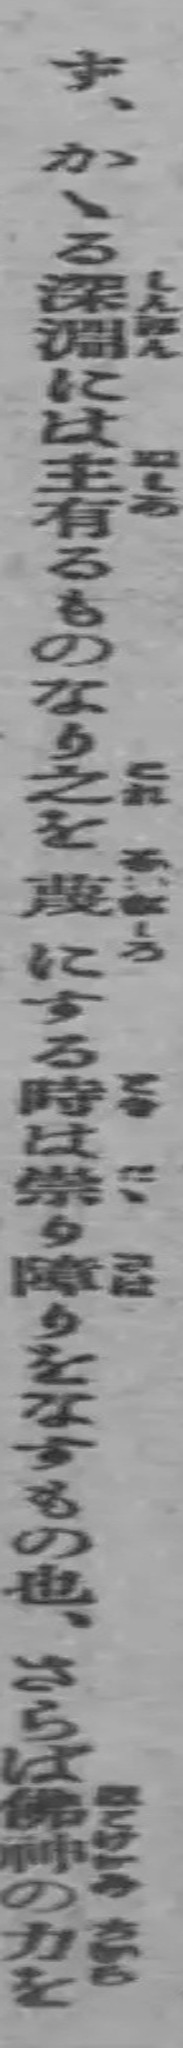ず、かゝる深淵には主有るものなり之を蔑にする時は祟り障りをなすもの也、さらば仏神の力を
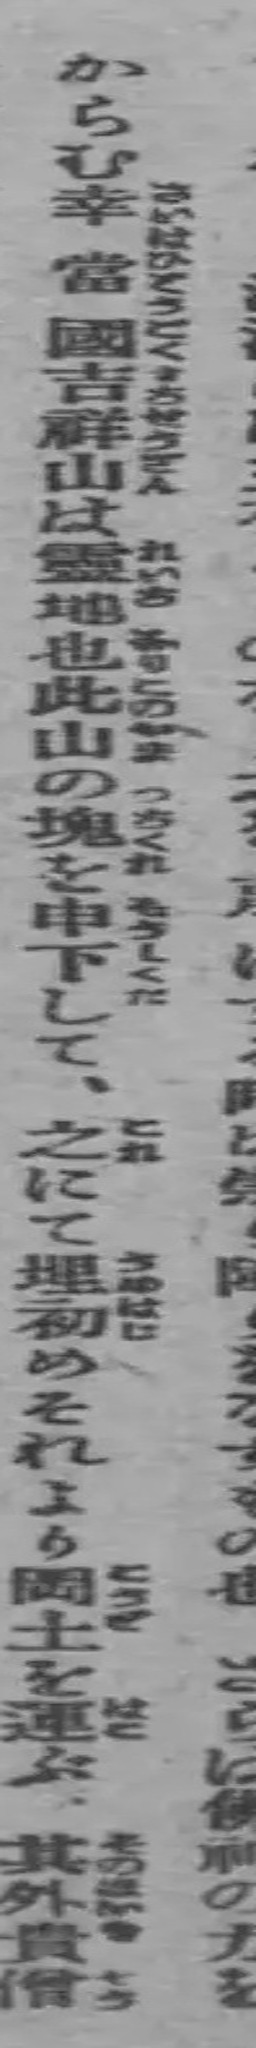からむ幸当国吉祥山は霊地也此山の塊を申下して、之にて埋初めそれより岡土を運ぶ、其外貴僧
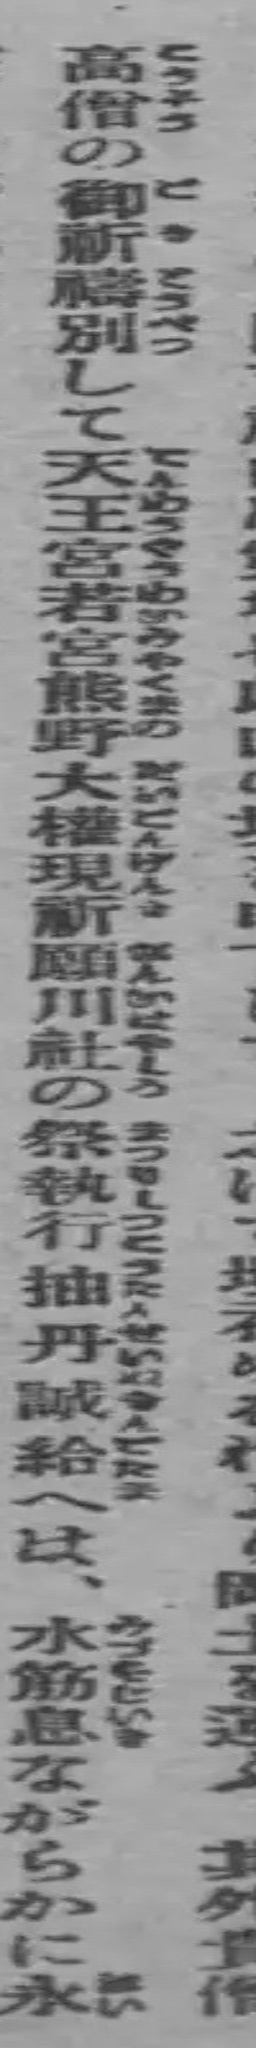高僧の御祈祷別して天王宮若宮熊野大権現祈願川社の祭執行抽丹誠給へは、水筋息ながらかに永
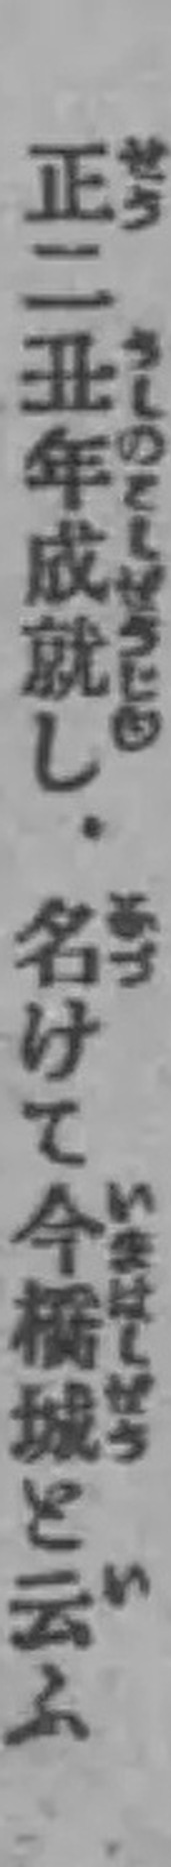正二丑年成就し、名けて今橋城と云ふ
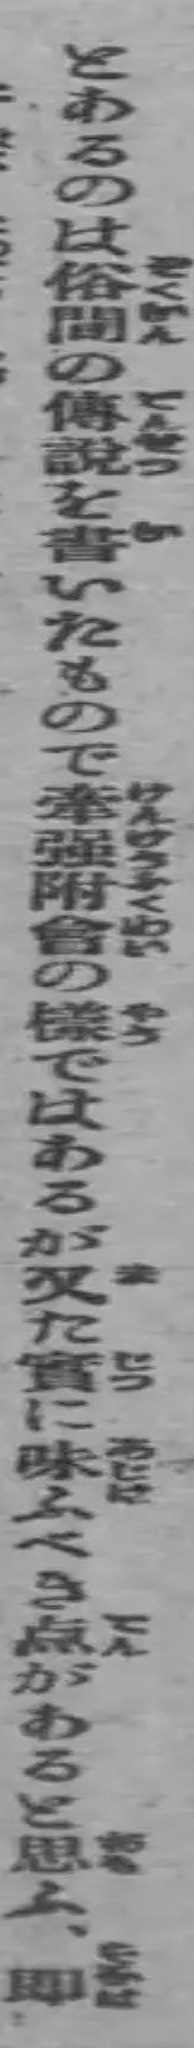とあるのは俗間の伝説を書いたもので牽強附会の様ではあるが又た実に味ふべき点があると思ふ、即
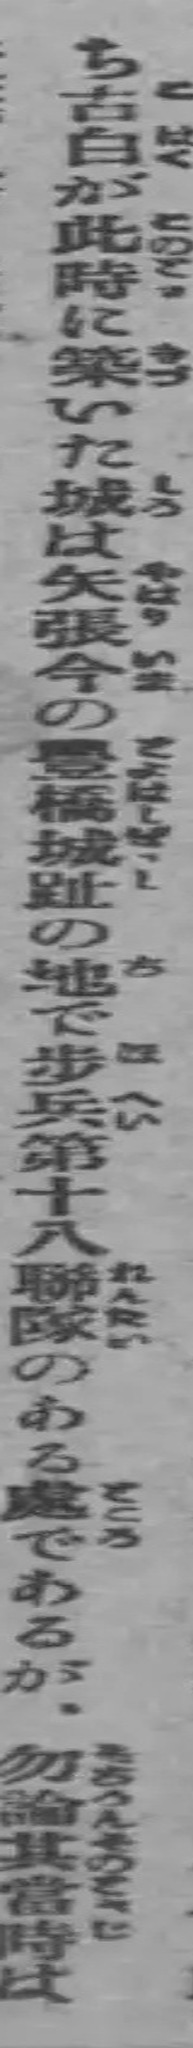ち古白が此時に築いた城は矢張今の豊橋城址の地で歩兵第十八連隊のある処であるが、勿論其当時は
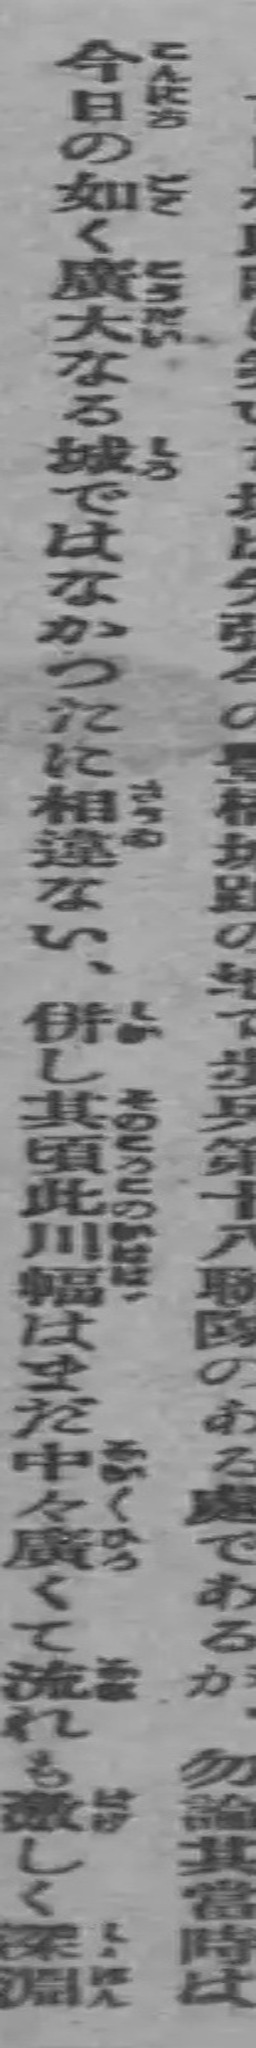今日の如く広大なる城ではなかつたに相違ない、併し其頃此川幅はまだ中々広くて流れも激しく深淵
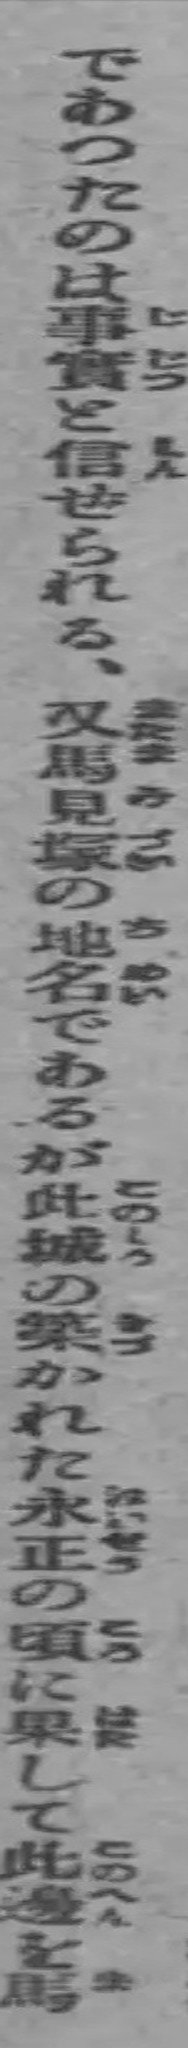であつたのは事実と信ぜられる、又馬見塚の地名であるが此城の築かれた永正の頃に果して此辺を馬

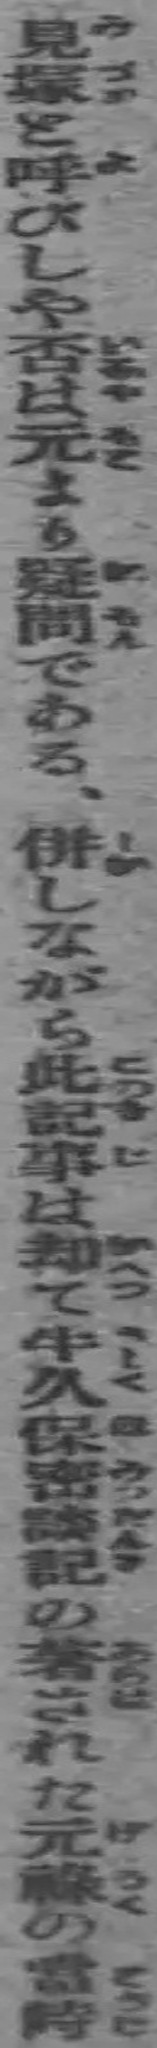馬見塚見塚と呼びしや否は元より疑問である、併しながら此記事は却て牛久保密談の著された元禄の当時
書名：豊橋市史談
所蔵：国立国会図書館 National Diet Library, JAPAN
